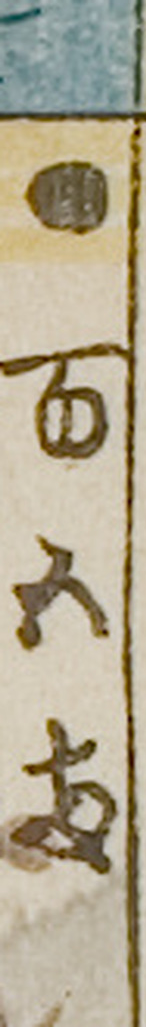●百五両
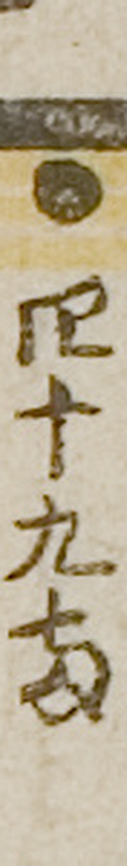●四十九両
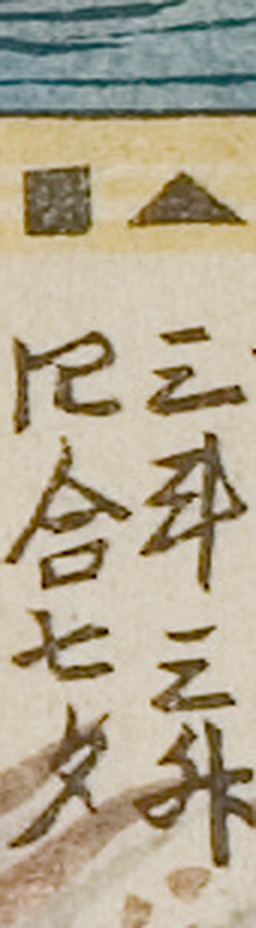四合七勺
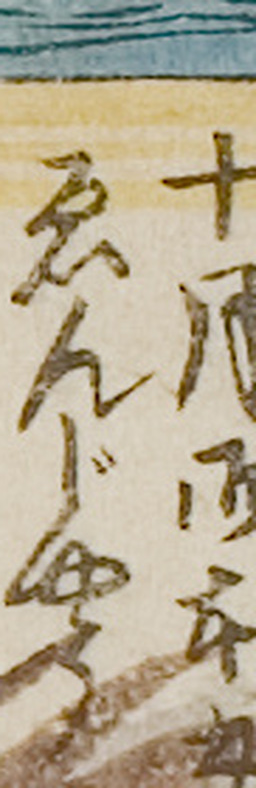ゑんじやう
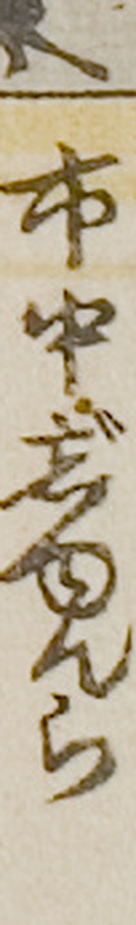市中じゆんら
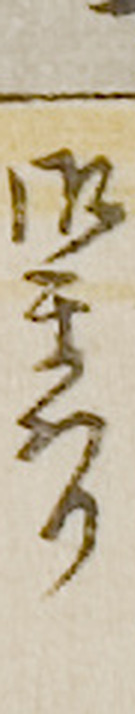御まはり
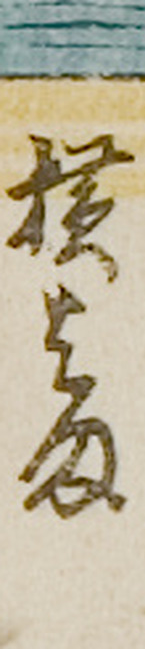横はま
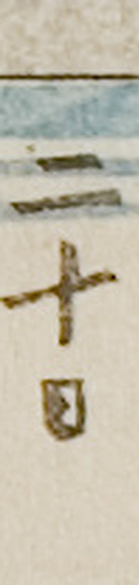二十日
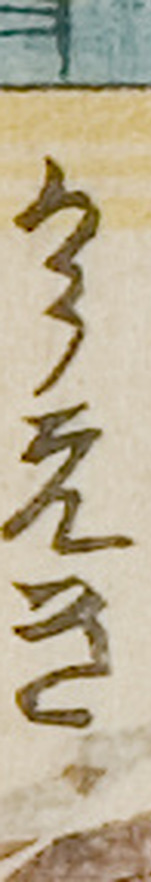かうえき
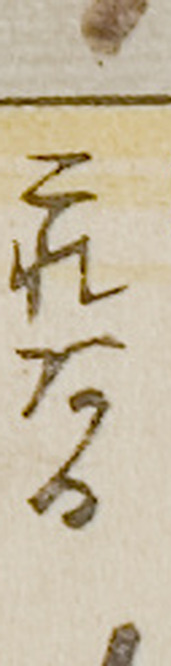これある
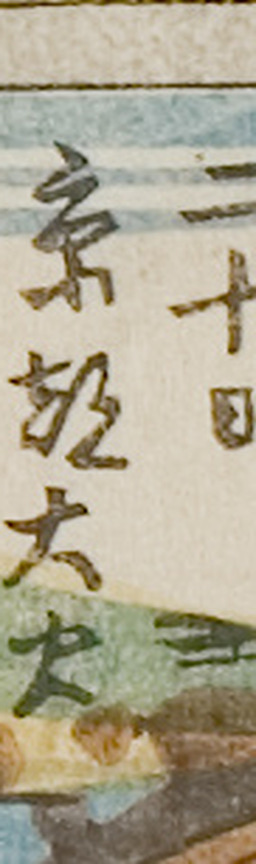京都大火
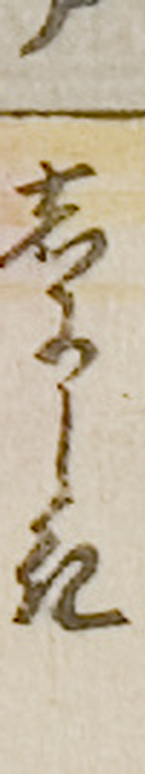しよしき
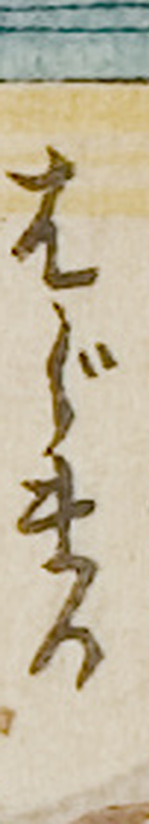はじまる
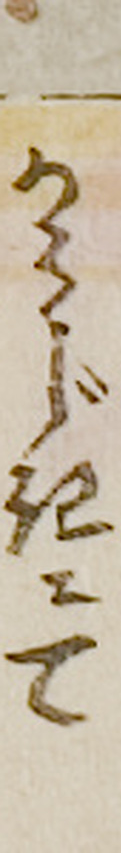かうじきにて
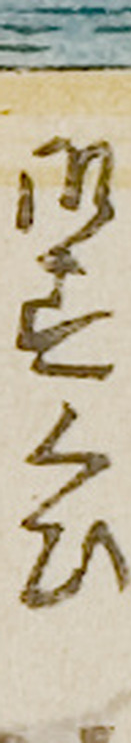御すくひ
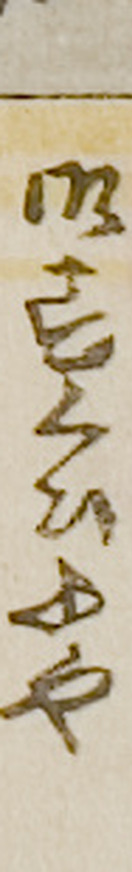御すくひ小や
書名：嘉永年間より米相場直段并年代記書抜大新版
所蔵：東京大学総合図書館 General Library in the University of Tokyo, JAPAN
